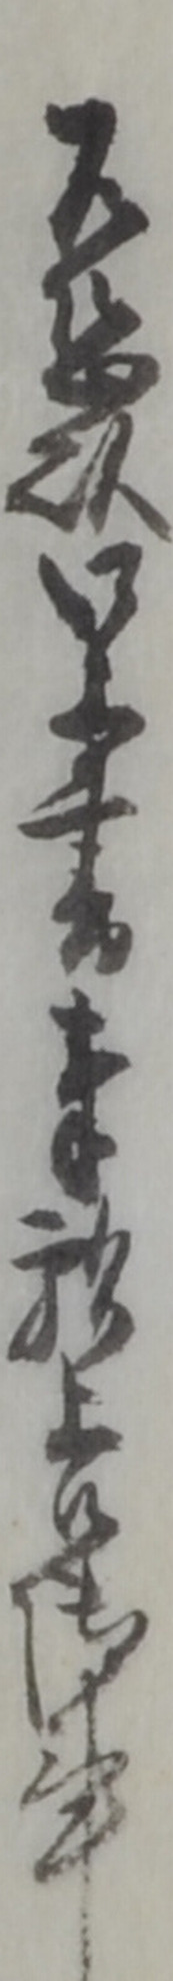乍恐以口上書奉願上候御事
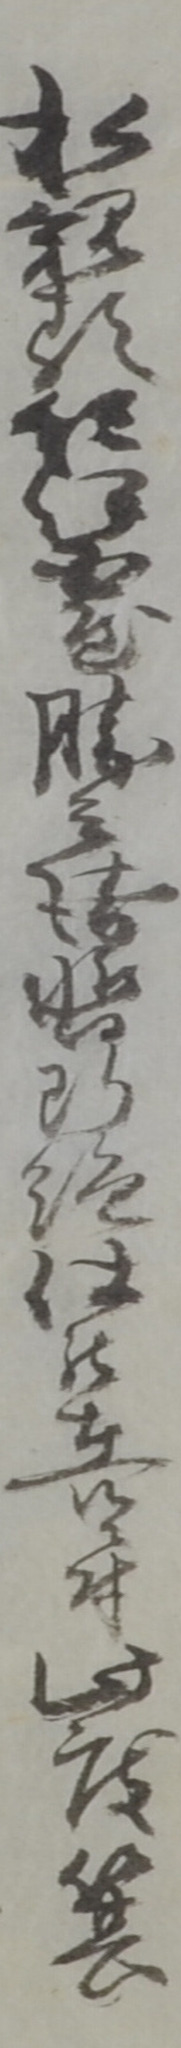私親類紀伊国屋勝兵衛暫断絶仕罷在候ニ付此度箕
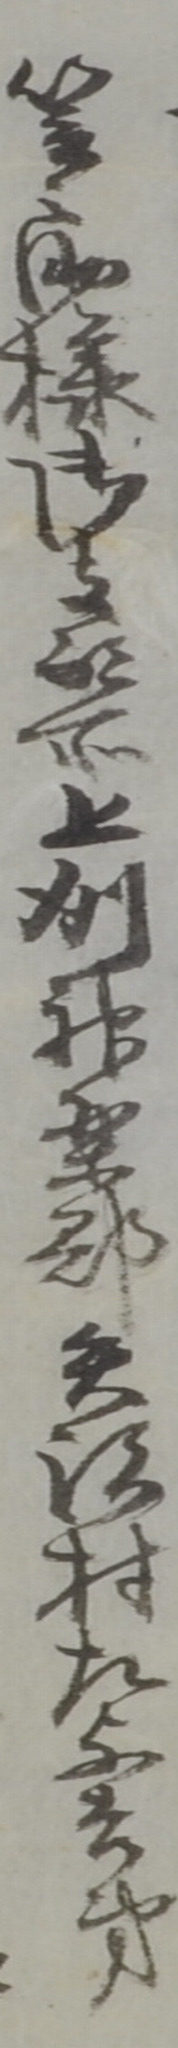笠之助様御支配所上州神楽郡矢沢村左与吉弟
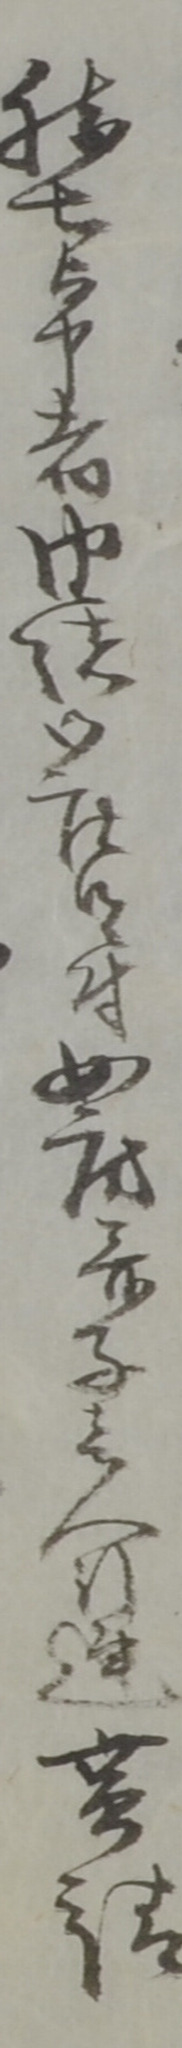勝七与申者由緒御座候ニ付女房幷子壱人引連貰請
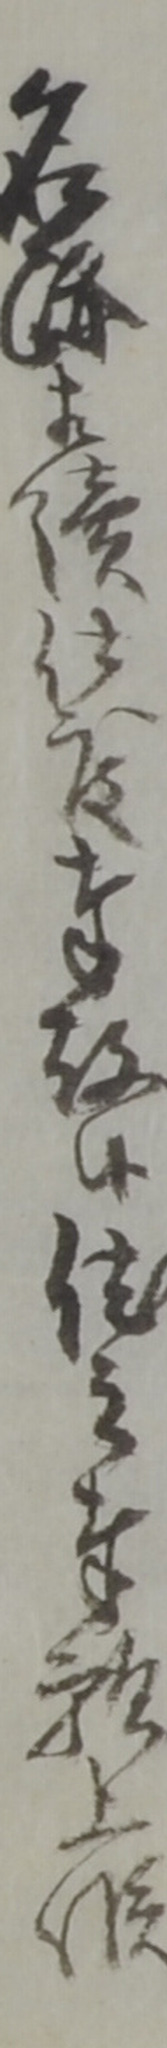名跡相続仕度奉存候依之奉願上候
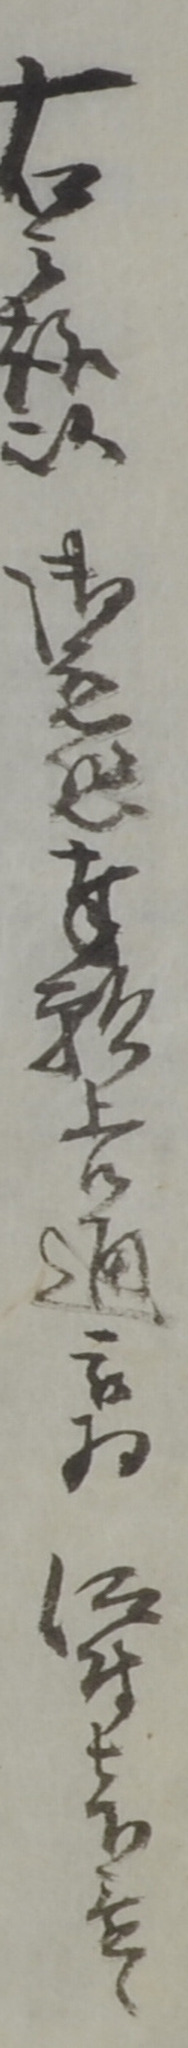右之趣以御慈悲奉願上候通被為仰付被下置候
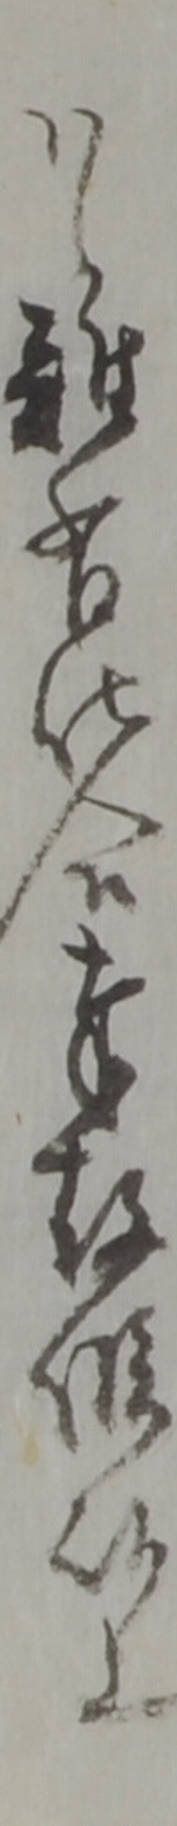ハヽ難有仕合奉存候以上
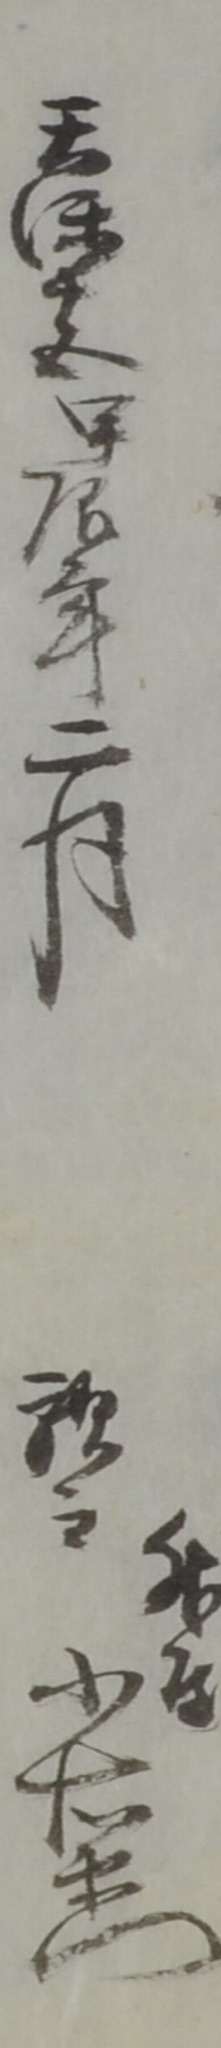天保十五甲辰年二月願主小右衛門
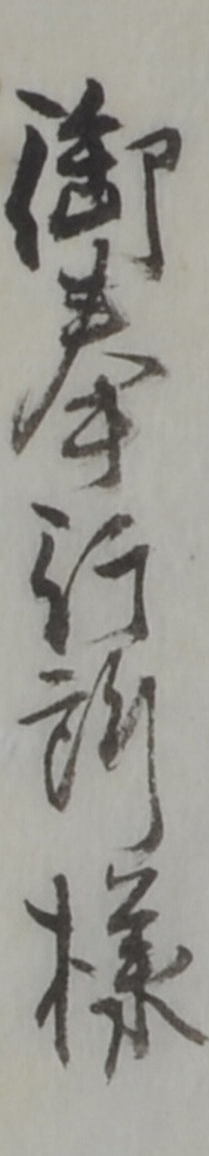御奉行所様
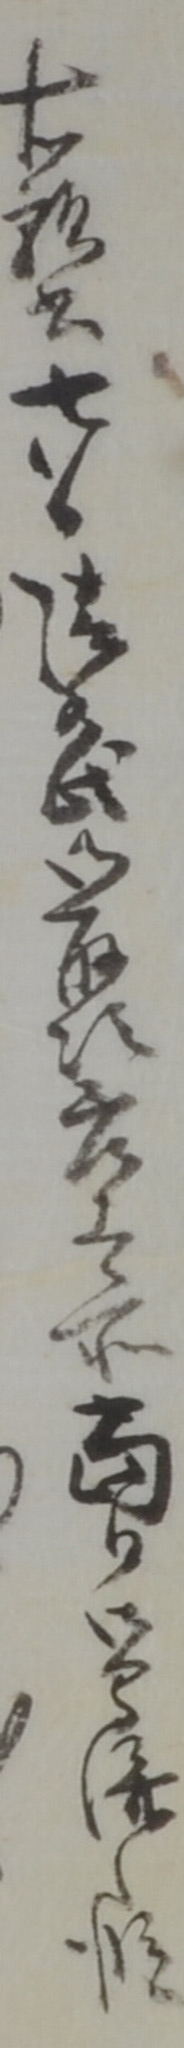右願書七日清水氏取次差上候所当日御聞済之段
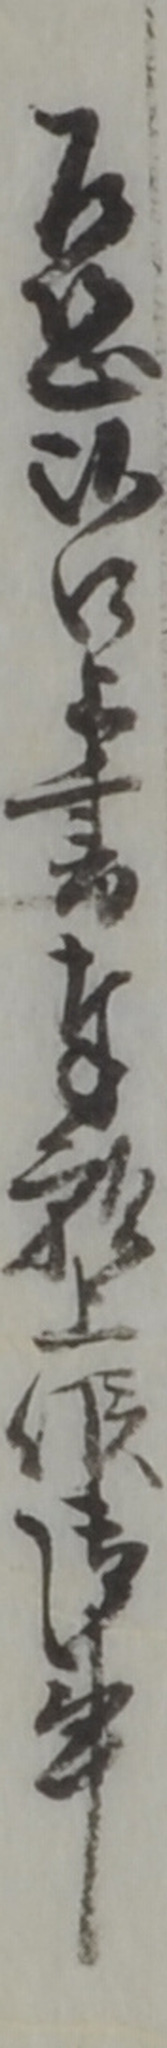乍恐以口上書奉願上候御事
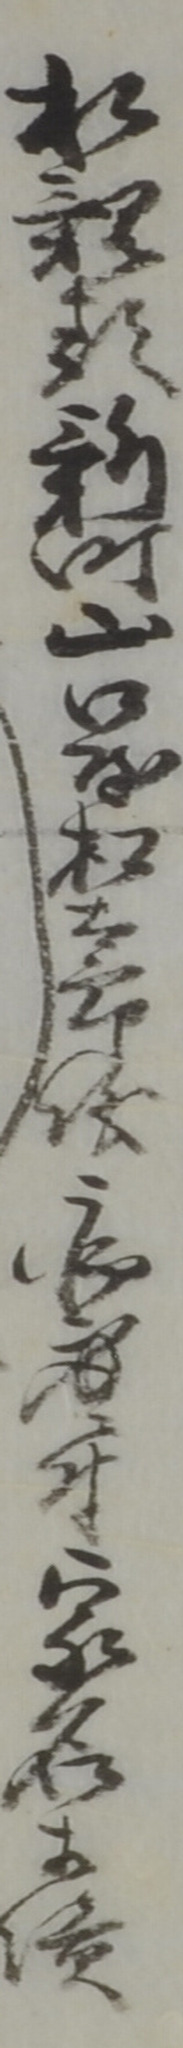私親類新町山口屋松太郎儀病身ニ付家名相続
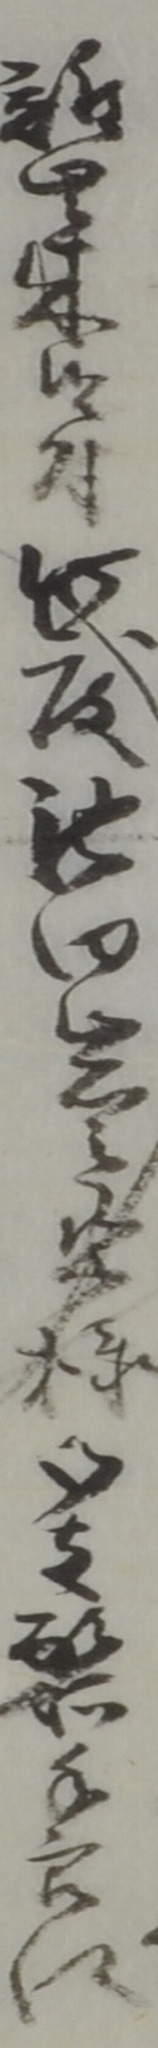難出来候ニ付此度池田岩之丞様御支配所手良郷
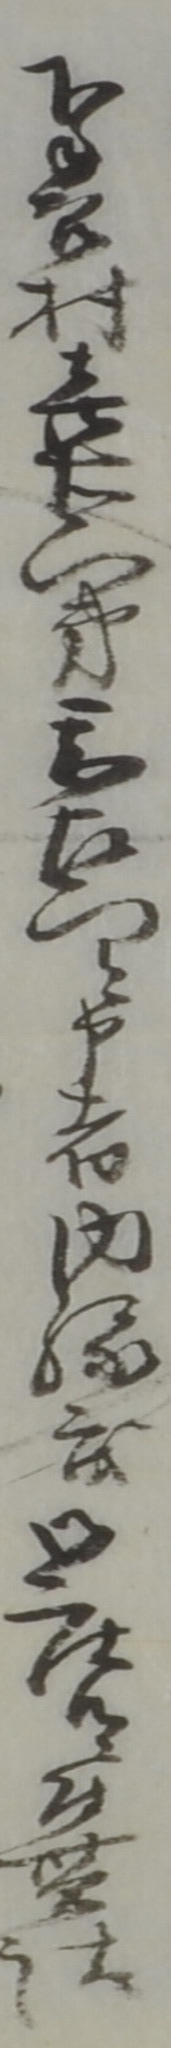下手良村喜右衛門弟甚左衛門と申者内談茂御座候ニ付貰請
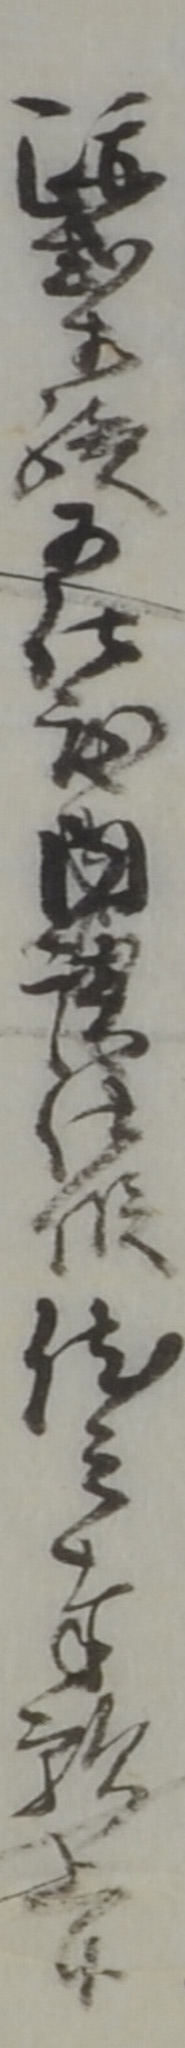跡式相続為仕度内談仕候依之奉願上候
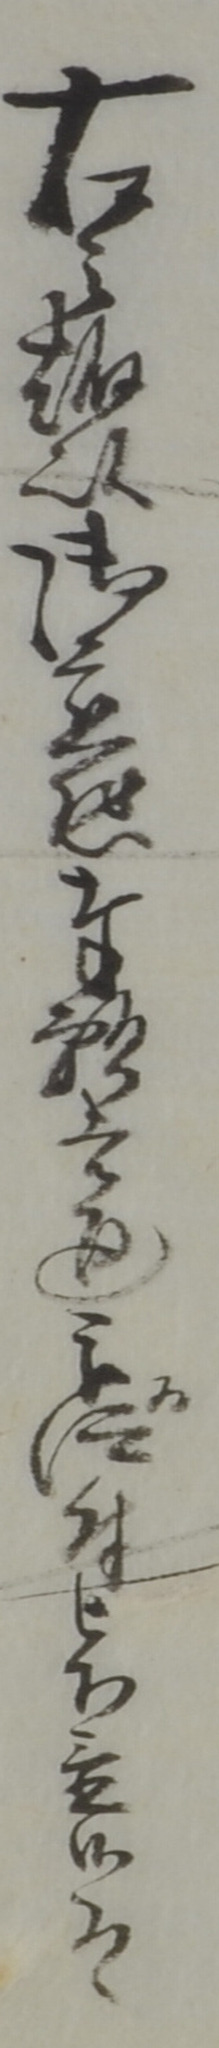右之趣以御慈悲奉願上候通被為仰付被下置候ハヽ
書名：諸願書控簿
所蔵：伊那市立高遠町図書館・合同会社AMANE
